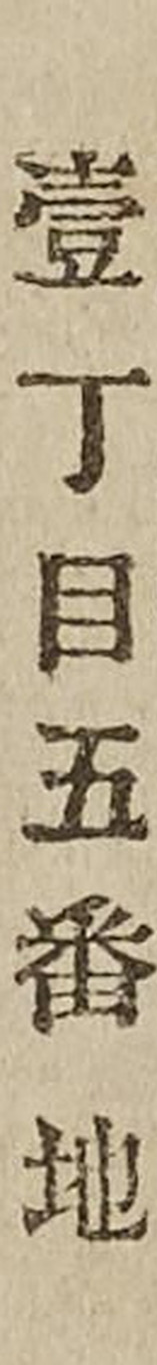壱丁目五番地
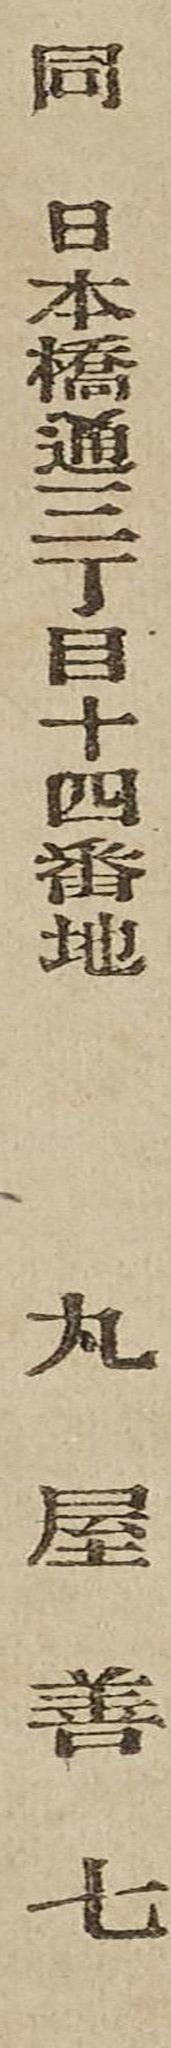同日本橋通三丁目十四番地丸屋善七
